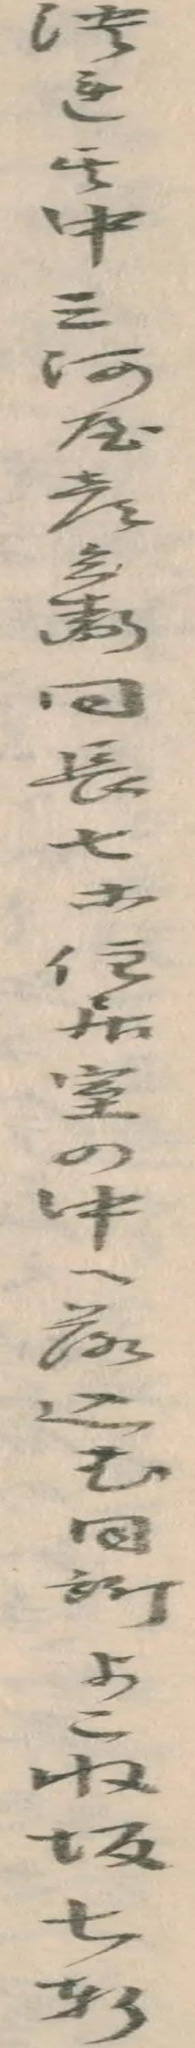潰れ其中三河屋彦兵衛同長七等住居室の中へ落込む同所よこね坂七軒
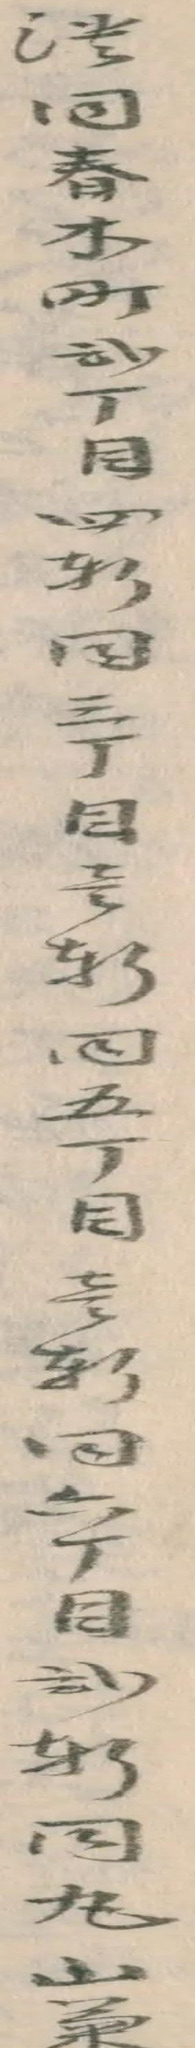潰同春木町弐丁目四軒同三丁目壱軒同五丁目壱軒同六丁目弐軒同丸山菊
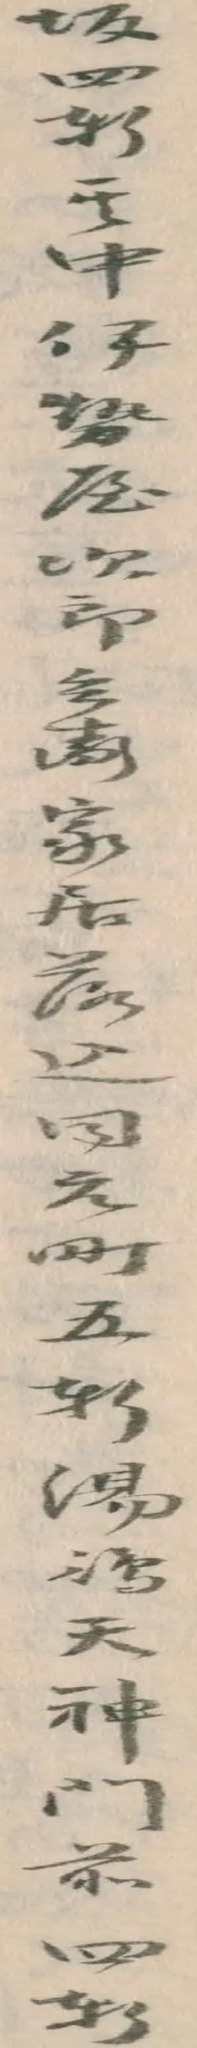坂四軒其中伊勢屋次郎兵衛家居落込同元町五軒湯嶋天神門前四軒
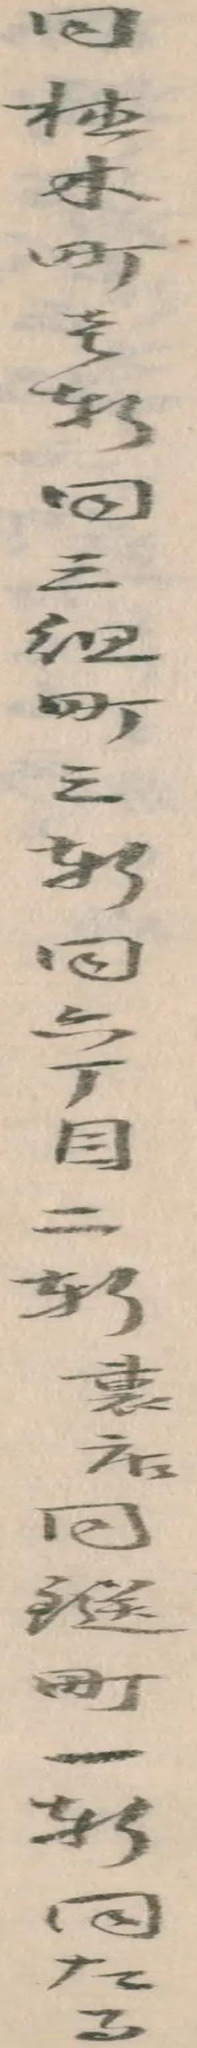同植木町壱軒同三組町三軒同六丁目二軒裏店同鎹町一軒同たる
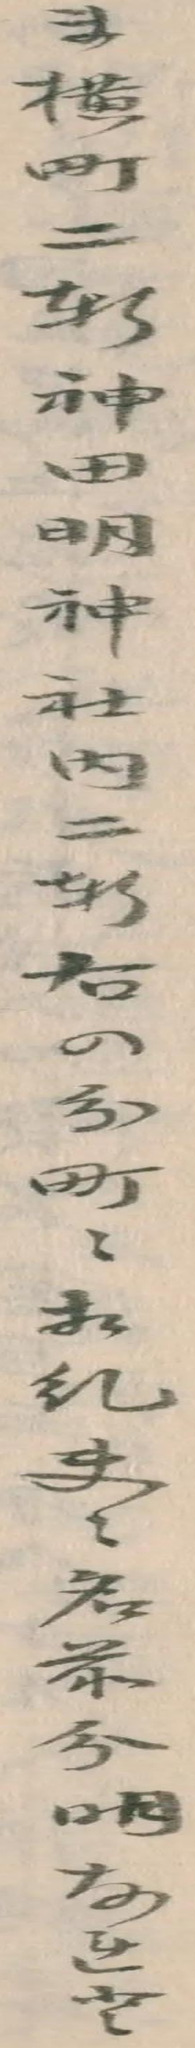ま横町二軒神田明神社内二軒右の分町々相糺夫々名前分明なれと
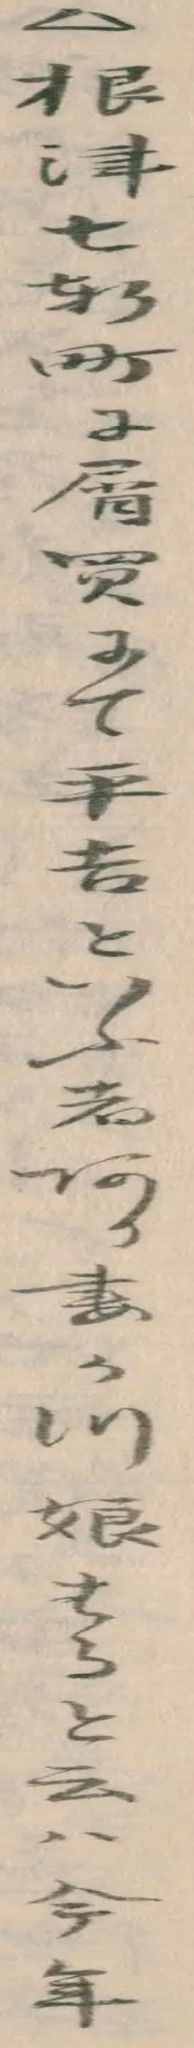△根津七軒町に屑買にて平吉といふ者あり妻かつ娘はると云は今年
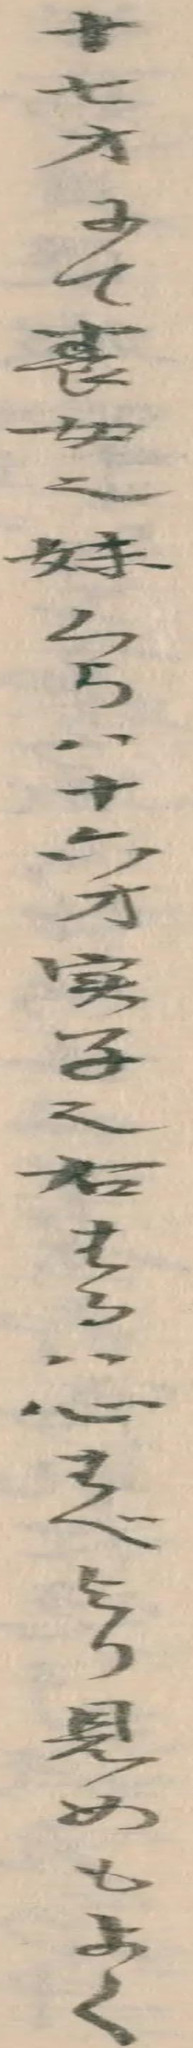十七才にて養女也妹くらは十六才実子也右はるは心はべより見めもよく
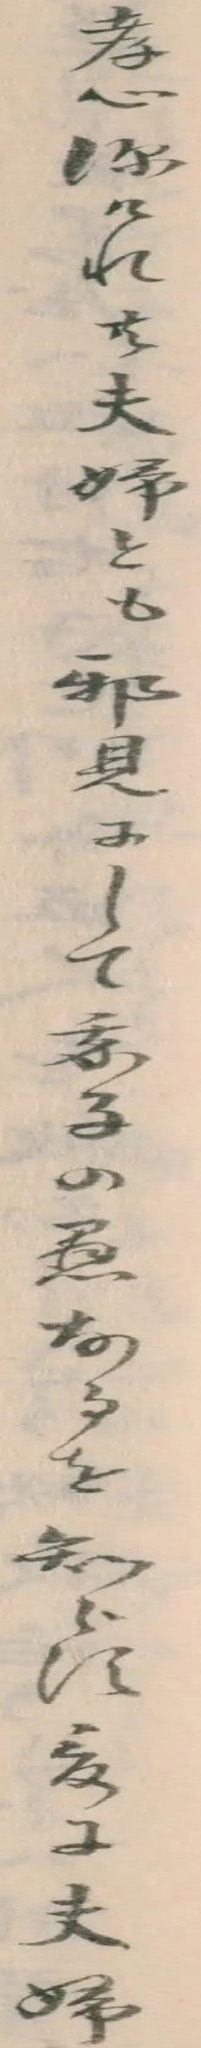孝心深けれ共夫婦とも邪見にして我子の愚なるを知らす爰に夫婦
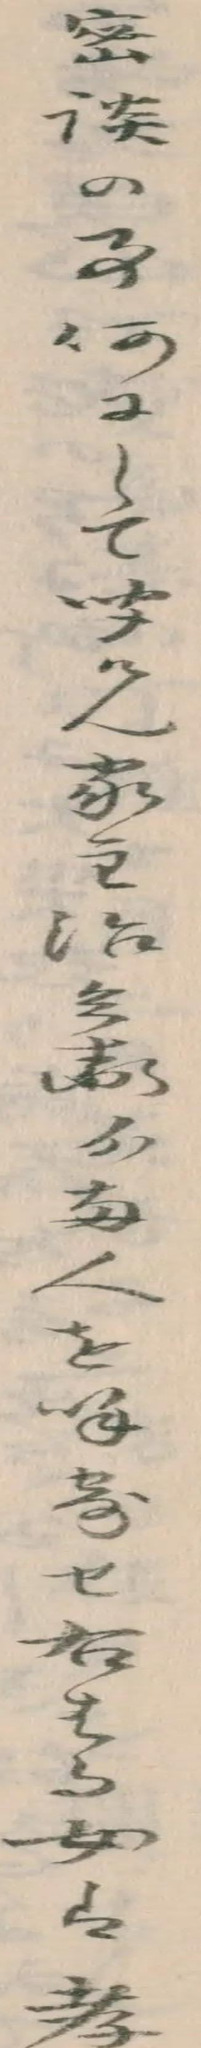密談の事何にして聞けん家主治兵衛ゟ両人を呼寄せ右はる女は孝
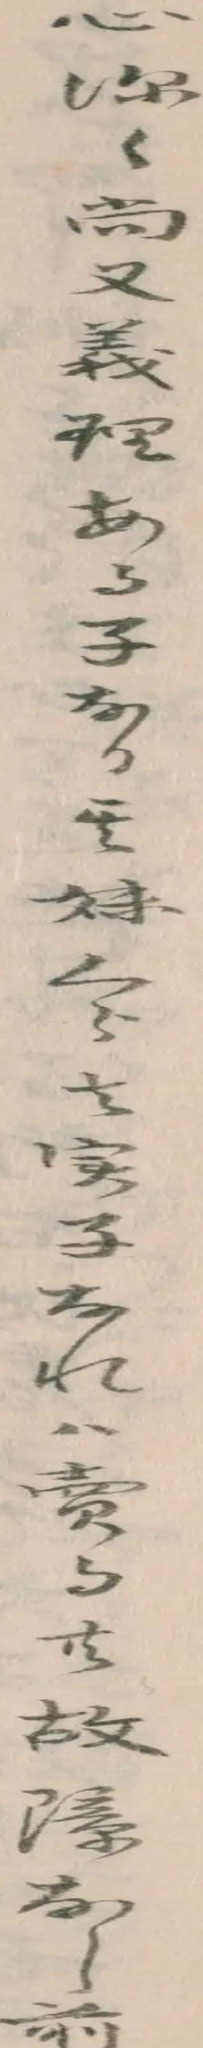心深く尚又義理ある子なり其妹くらは実子なれは売る共故障なし前
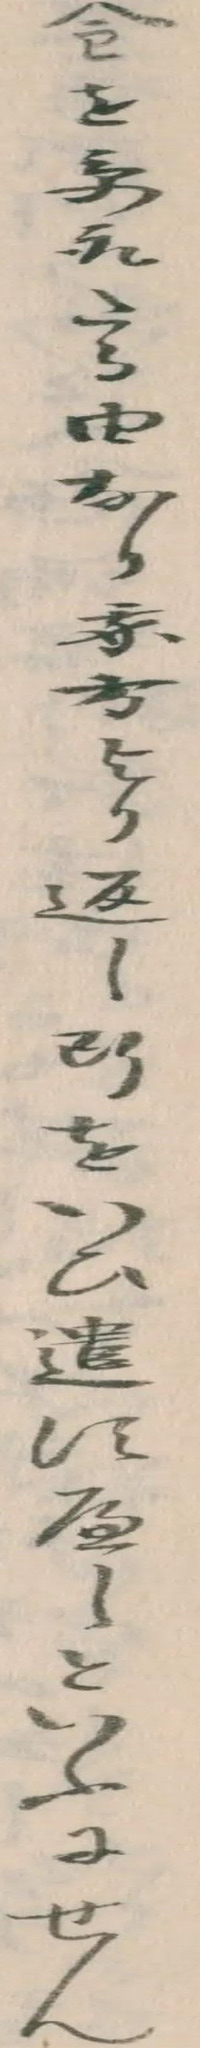金を受取たる由なり我方より返し断をいひ遣すへしといふにせん
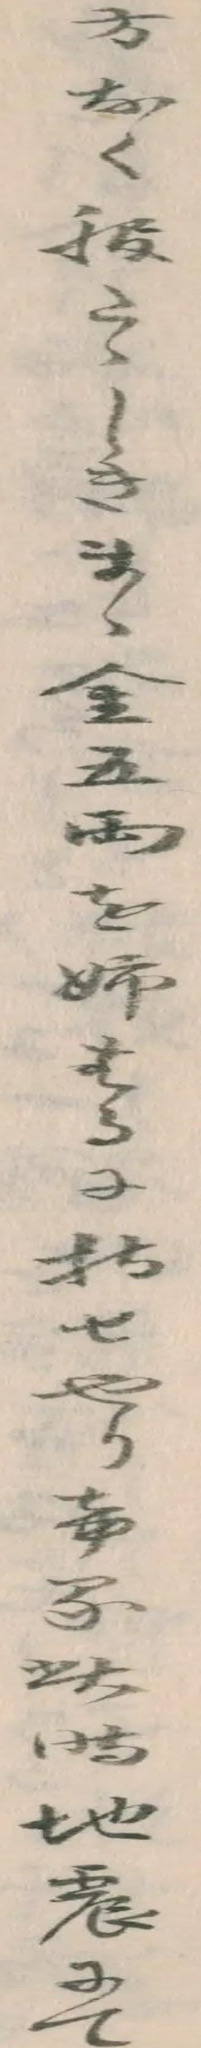方なく腹たゝしきまゝ金五両を姉はるに持せやりける此時地震にて
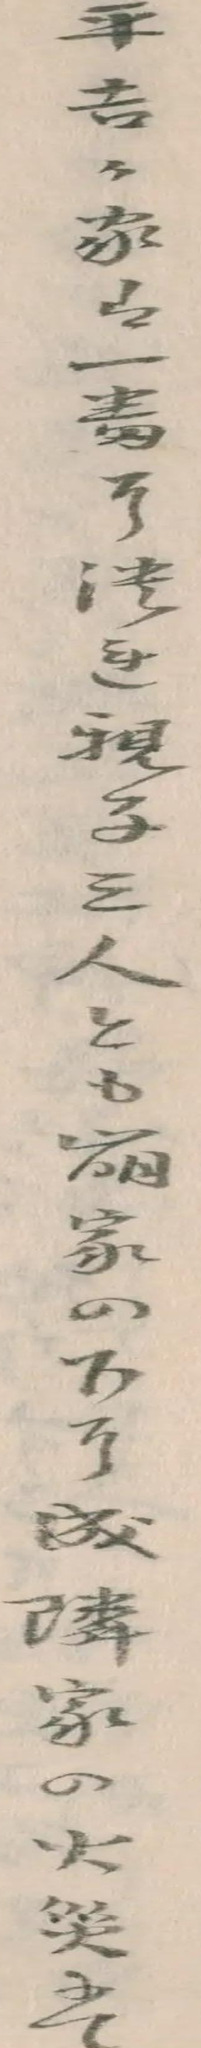平吉か家は一番に潰れ親子三人とも崩家の下に成隣家の火災にて
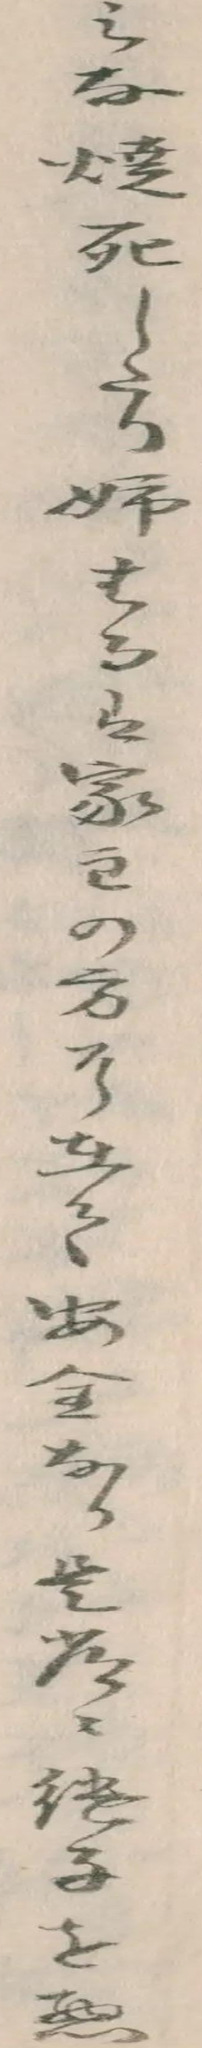みな焼死したり姉はるは家主の方に在て安全なり是常に継子を悪
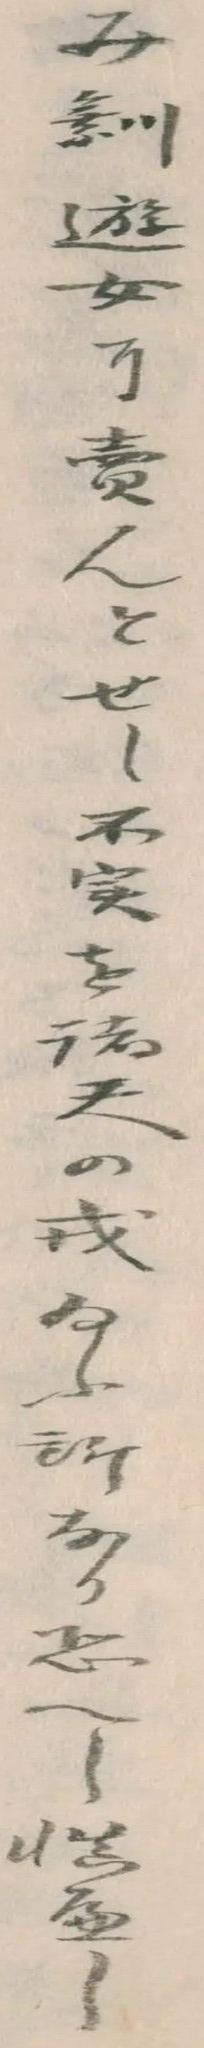み剰遊女に売んとせし不実を諸天の戒給ふ所なり恐へし慎へし
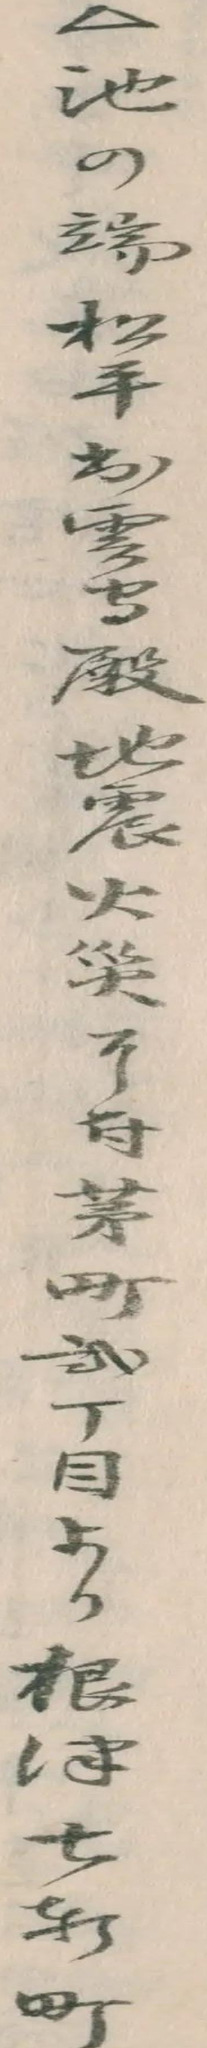△池の端松平出雲守殿地震火災に付茅町弐丁目より根津七軒町
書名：地災撮要. 巻10(地震之部) 上,下
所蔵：国立国会図書館 National Diet Library, JAPAN
